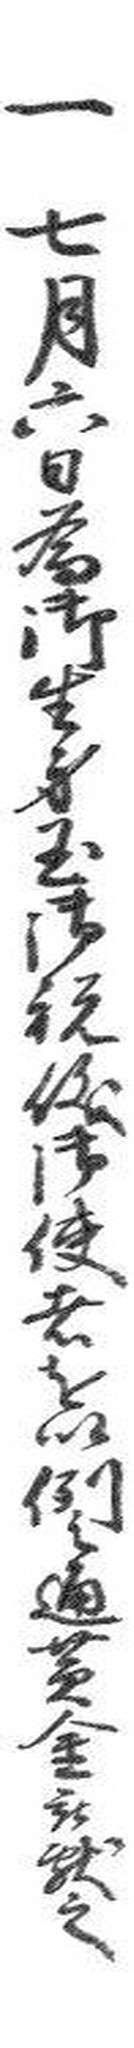一七月六日為御生身玉御祝儀御使者を以例之通黄金被献之
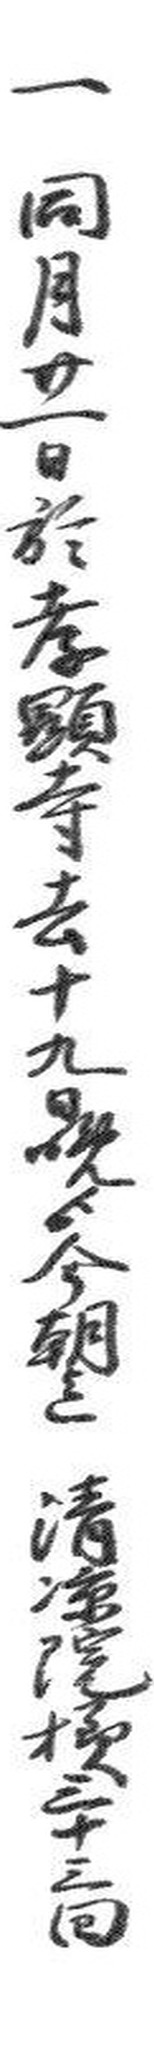一同月廿一日於孝顕寺去十九日晩ゟ今朝迄清涼院様三十三回
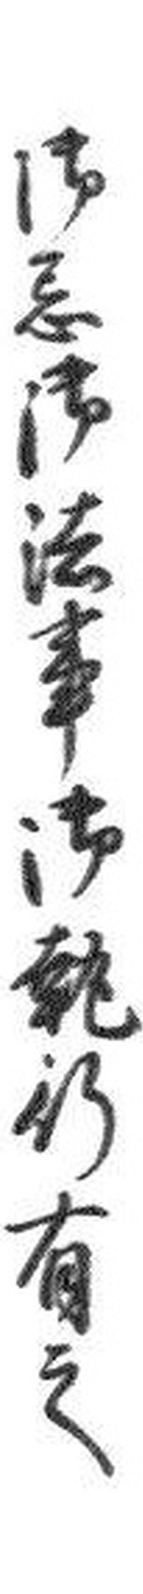御忌御法事御執行有之
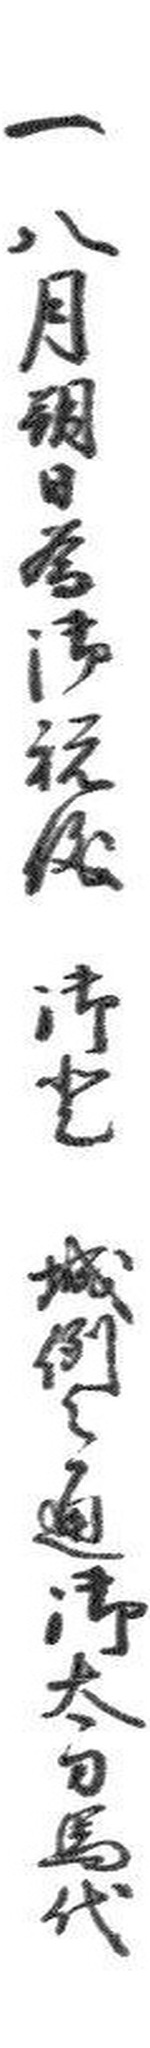一八月朔日為御祝儀御登城例之通御太刀馬代
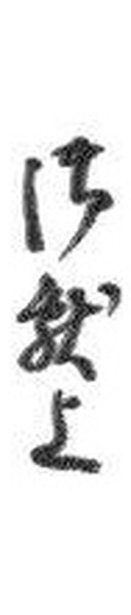御献上
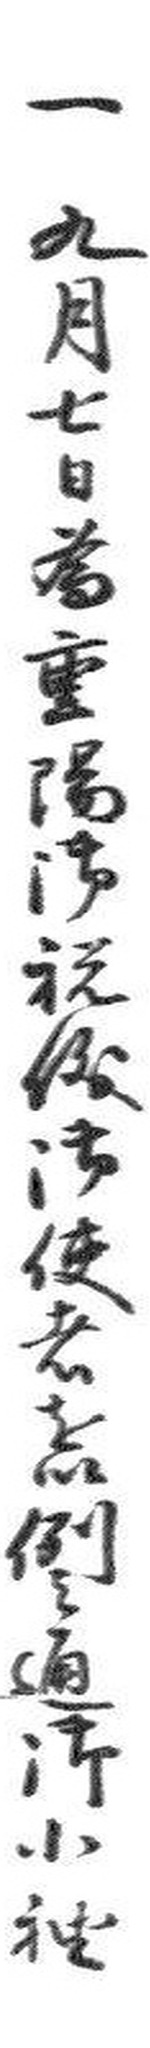一九月七日為重陽御祝儀御使者を以例之通御小袖
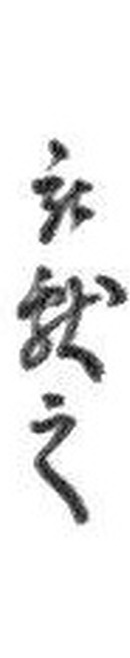被献之
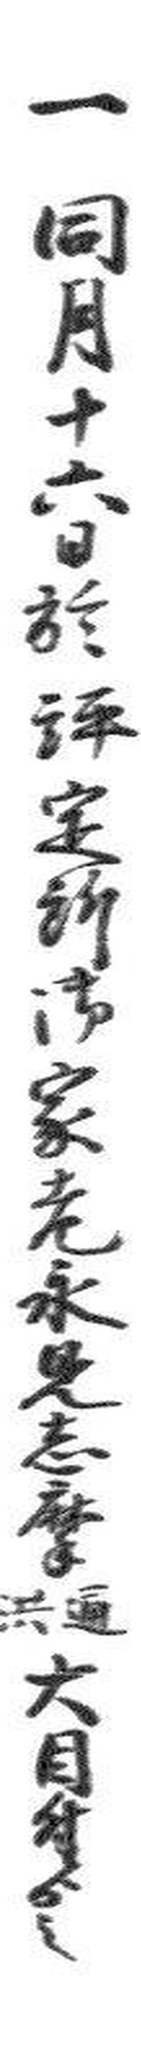一同月十六日於評定所御家来永見志摩通洪大目付ゟ之
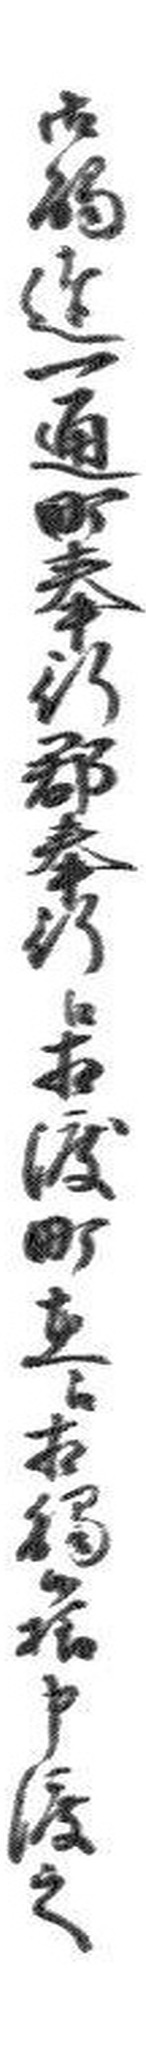御触達一通町奉行郡奉行江相渡町在江相触候様申渡之
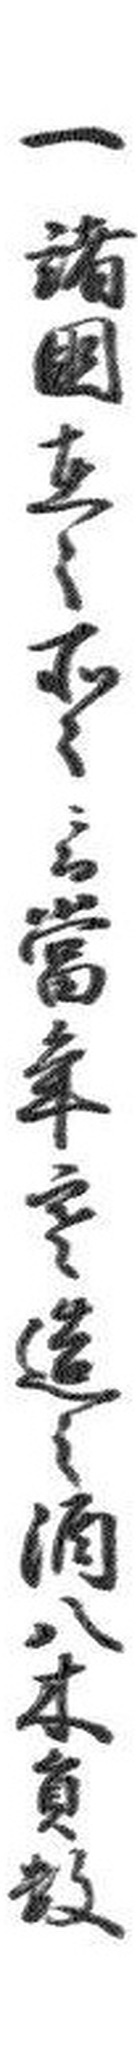一諸国在々所々ニ而当年寒造之酒八木員数
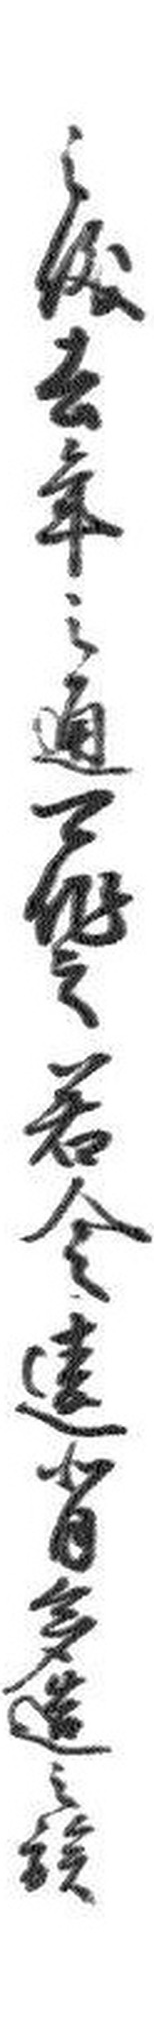之儀去年之通可作之若令違背多造之族

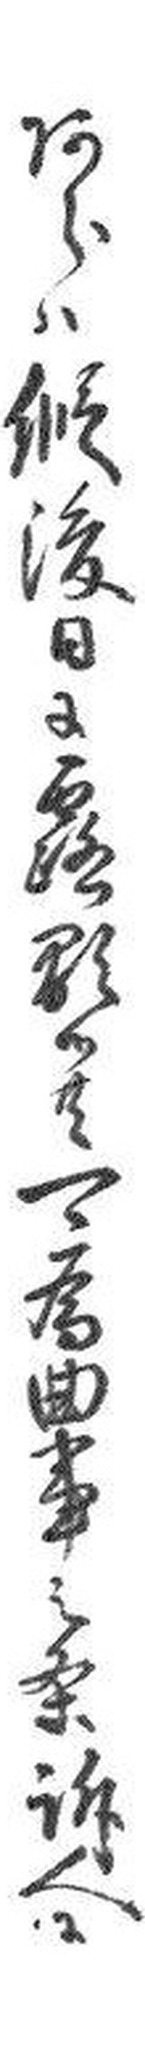あらは仮後日に露顕候共可為曲事之条訴人に
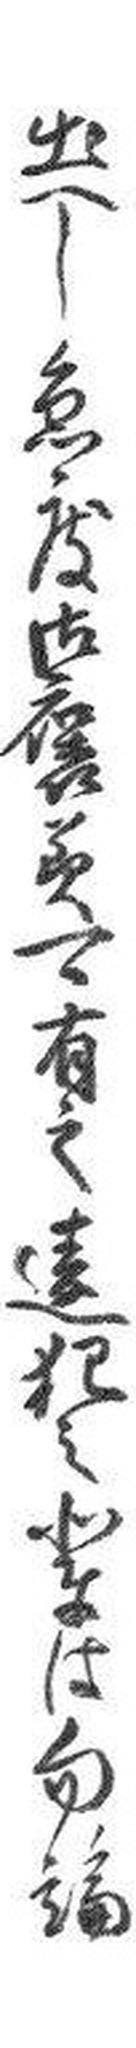出へし急度御褒美可有之違犯之輩は勿論
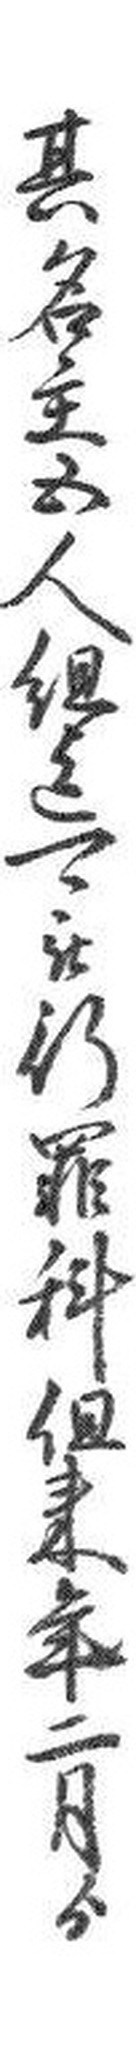其名主五人組迄可被行罪科但来年二月ゟ
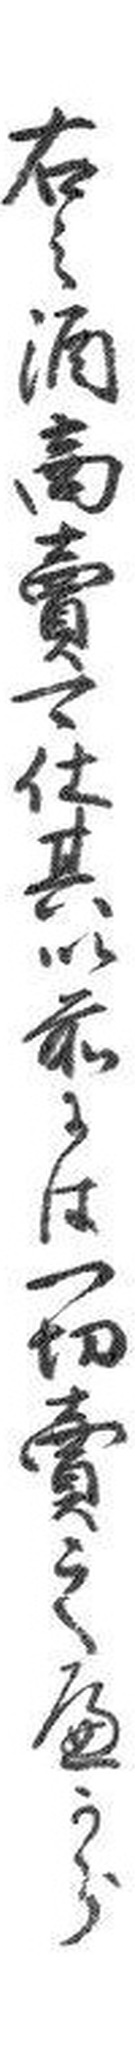右之酒商売可仕其以前には一切売之へから
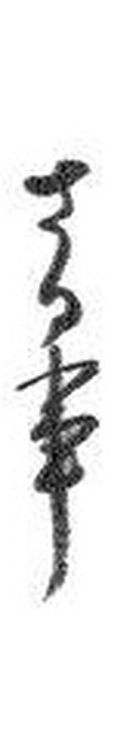さる事
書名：家譜 八 光通公 従寛文十年到同十二年
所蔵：福井県文書館 Fukui Prefectural Archives
